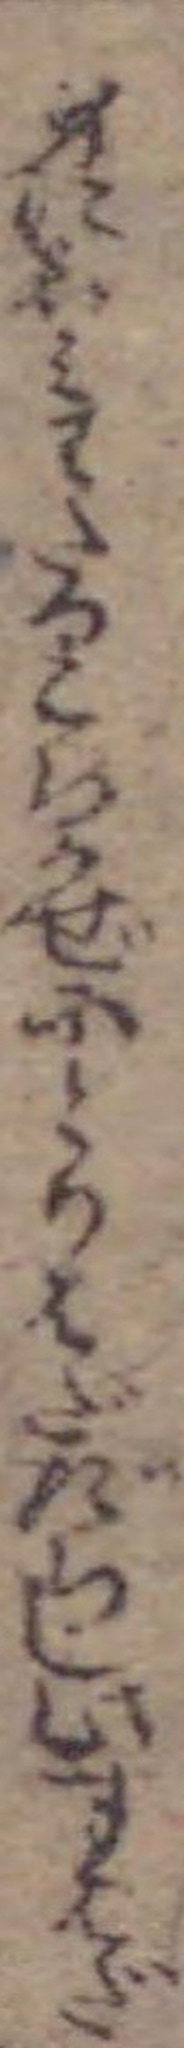身にしみわたるこちかぜにとりはだだちし此すはだ
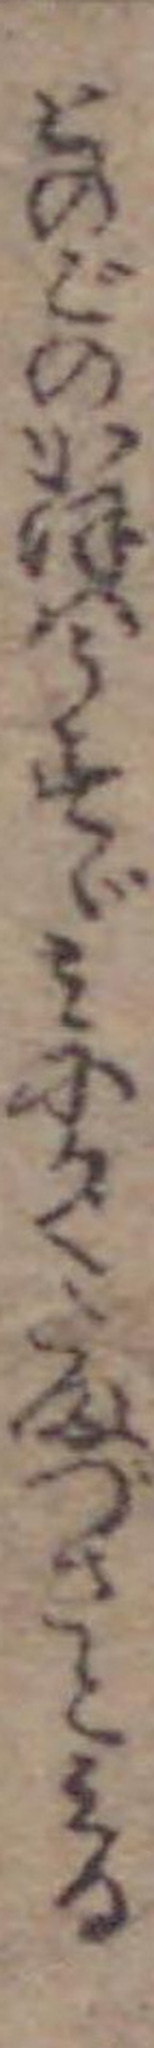とのごのかほはうすゞみにかくたまづさとみる
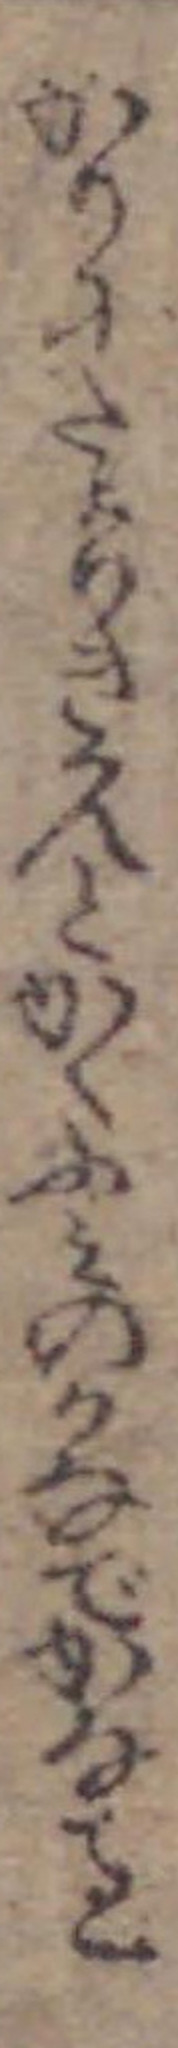かりにたよりきかんとかくふみのかなでかなてこ
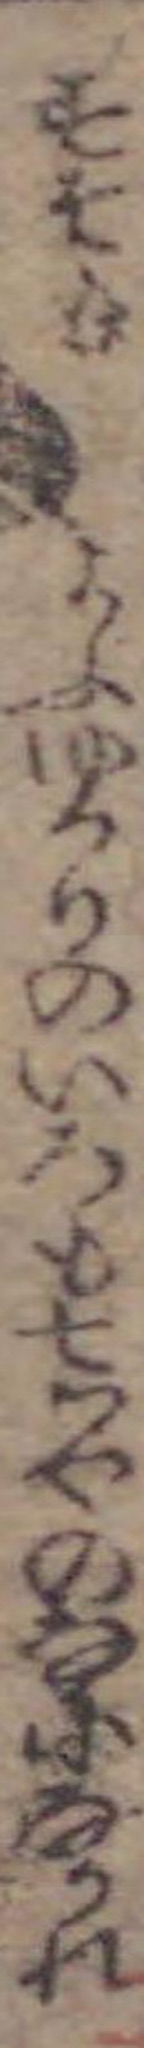すそもよふゆかりのいろも七つやのなになかれ
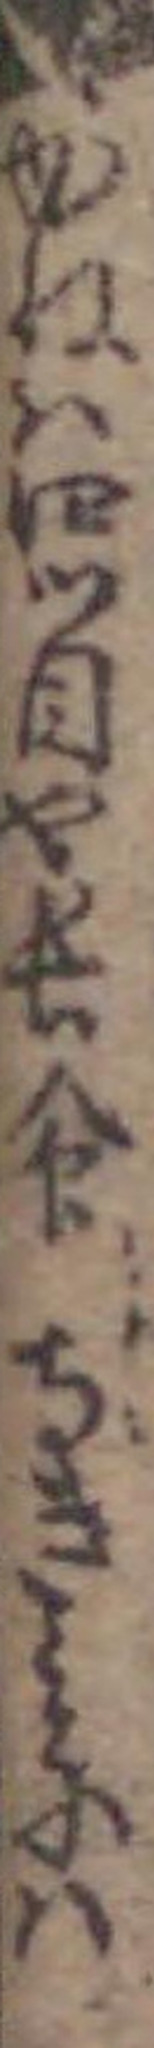かねは四ツ目や長命寺きみには
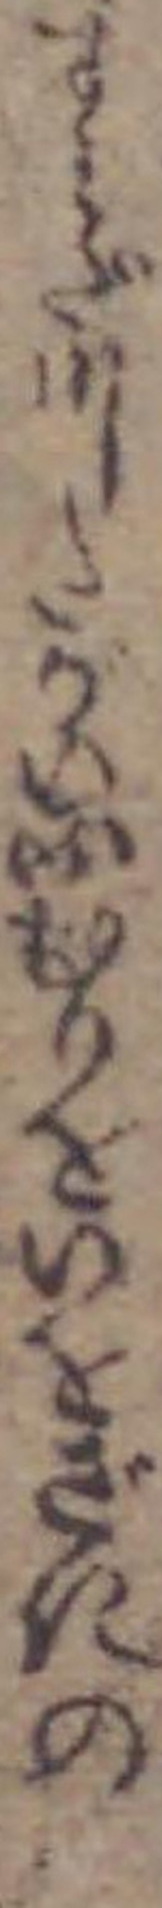たるすみだ川たがいにむりをいをざきの
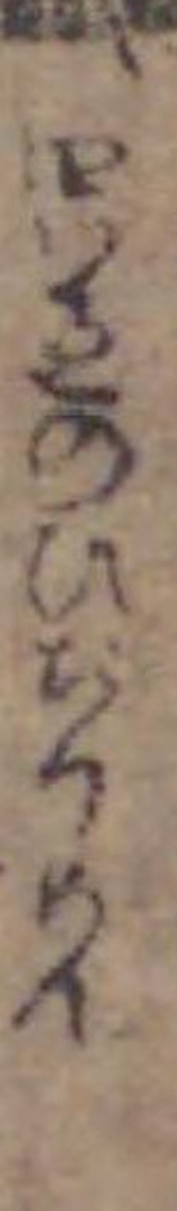四ツ過のひぢりめん
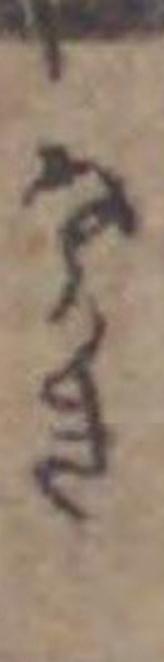なかき
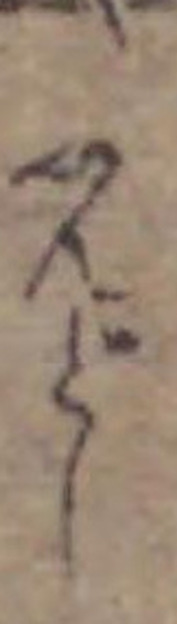ふんどし
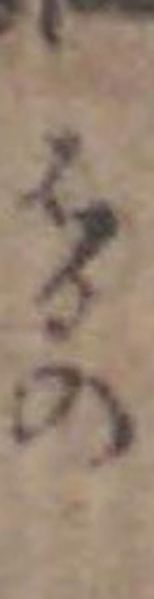はるの
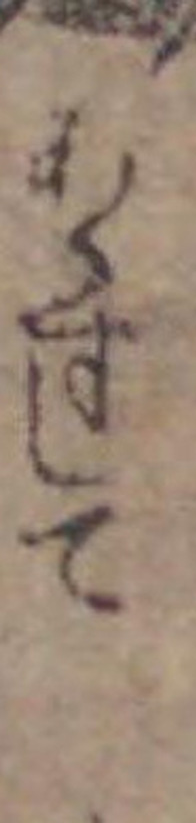あらすして
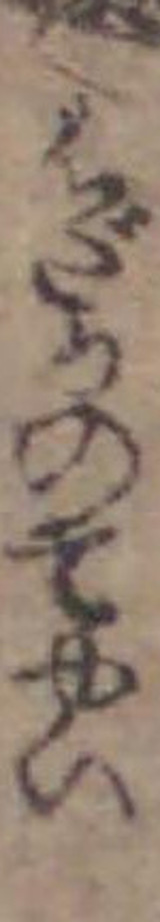はだかのてやい
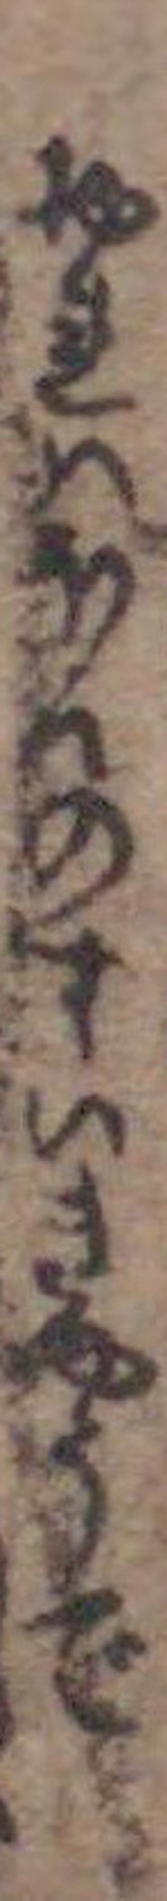おれはほんのすいきやうでした
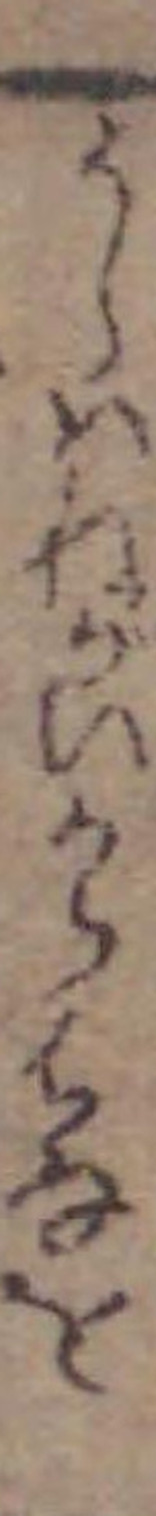うしはねがいからはなを
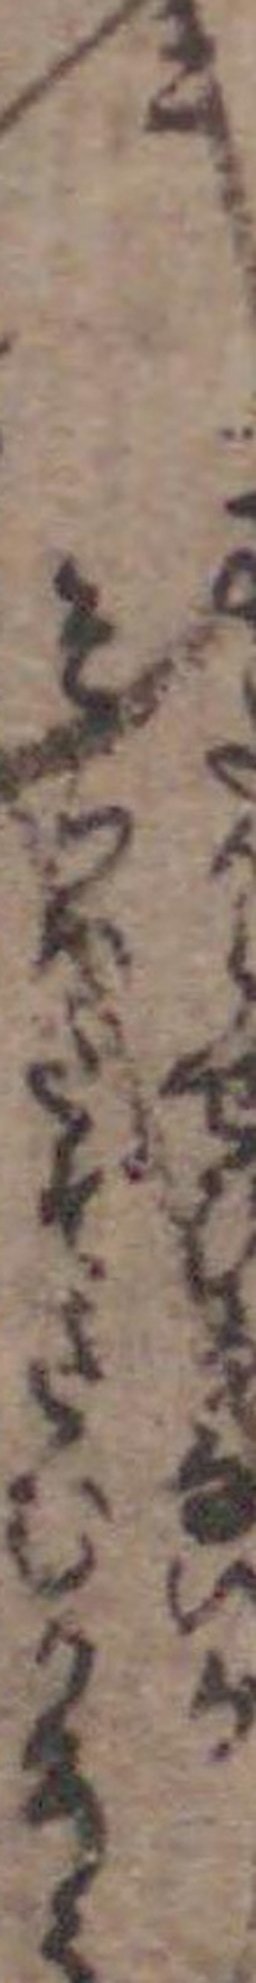そちはさそさむかろう
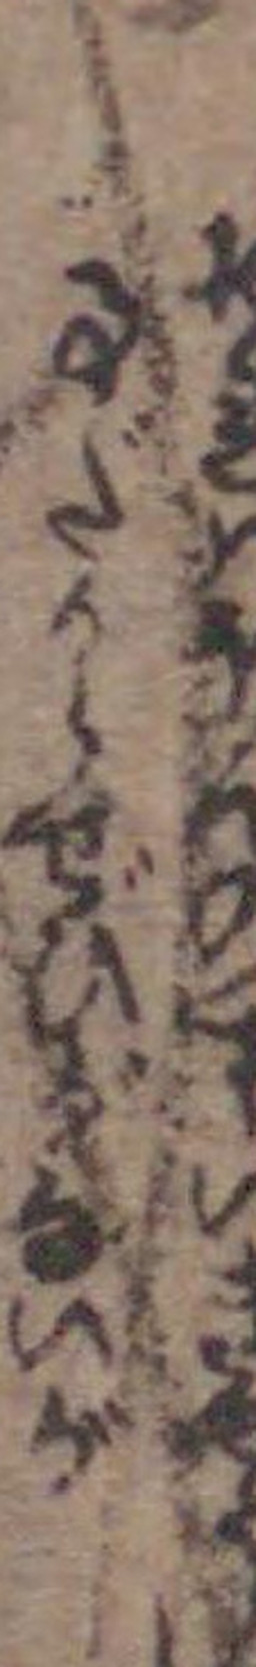事だからぜひがないが
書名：江戸生艶気樺焼 : 3巻
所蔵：国立国会図書館 National Diet Library, JAPAN
